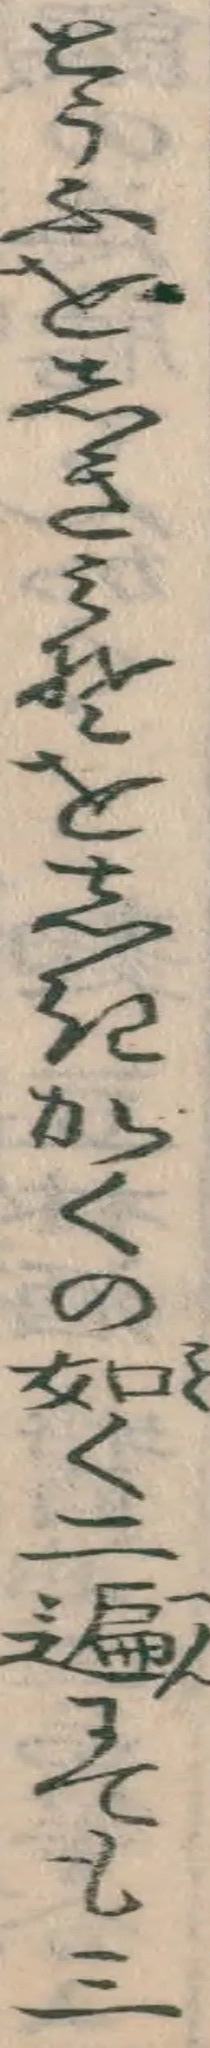とうふをしきみそをしきかくの如く二遍にても三
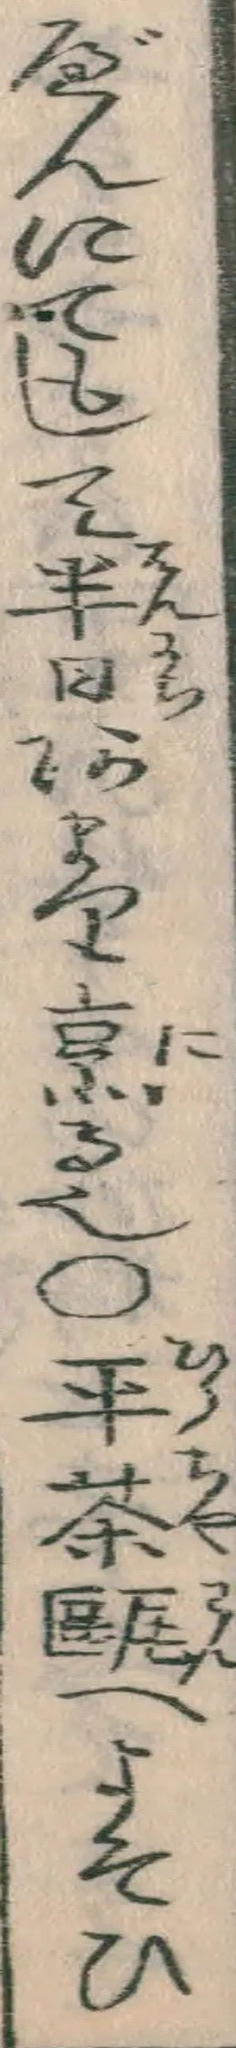べんにてもして半日あまり烹る也○平茶甌へよそひ
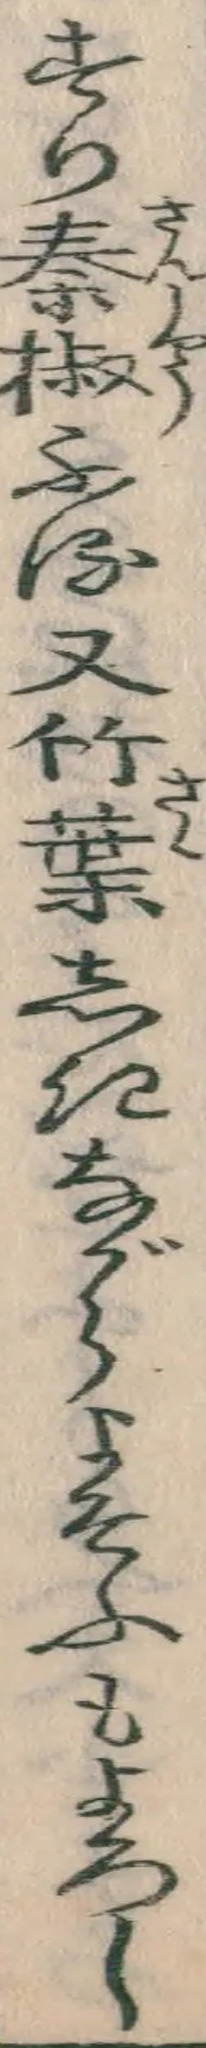すり秦椒ふる又竹葉しきながらよそふもよろし
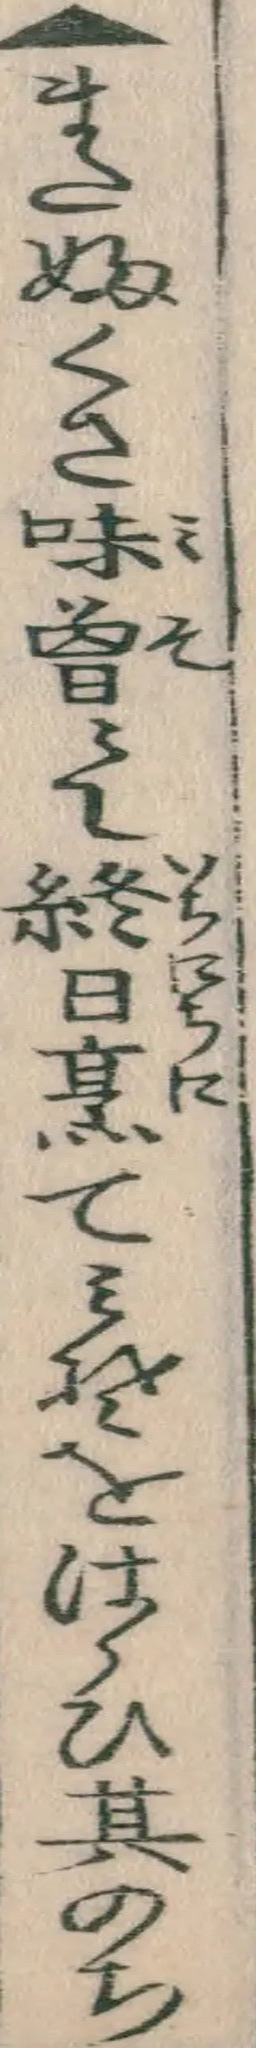▲またふくさ味曾にて終日烹てみそをはらひ其のち
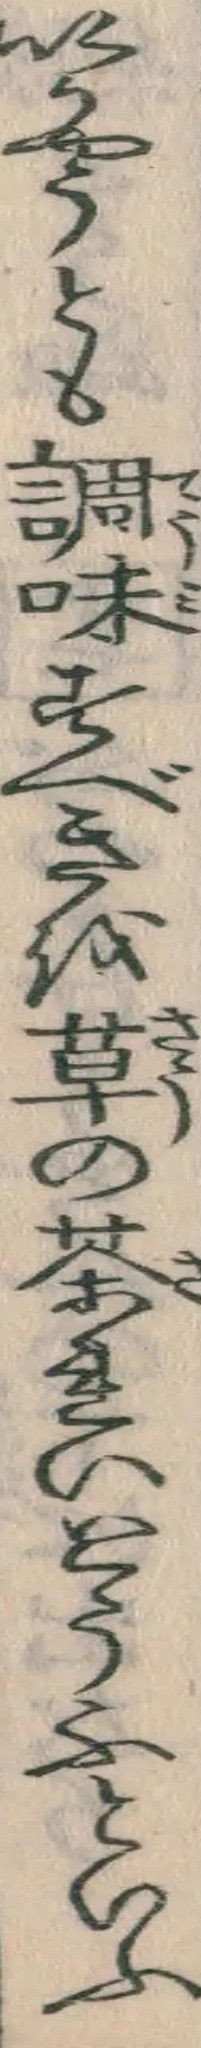いかやうとも調味すべきを草の茶れいとうふといふ
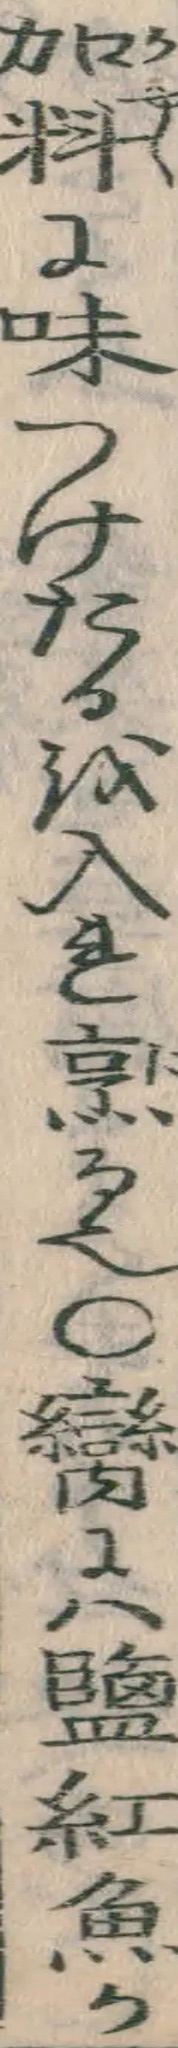加料に味つけたるを入れ烹る也○臠には鹽紅魚か
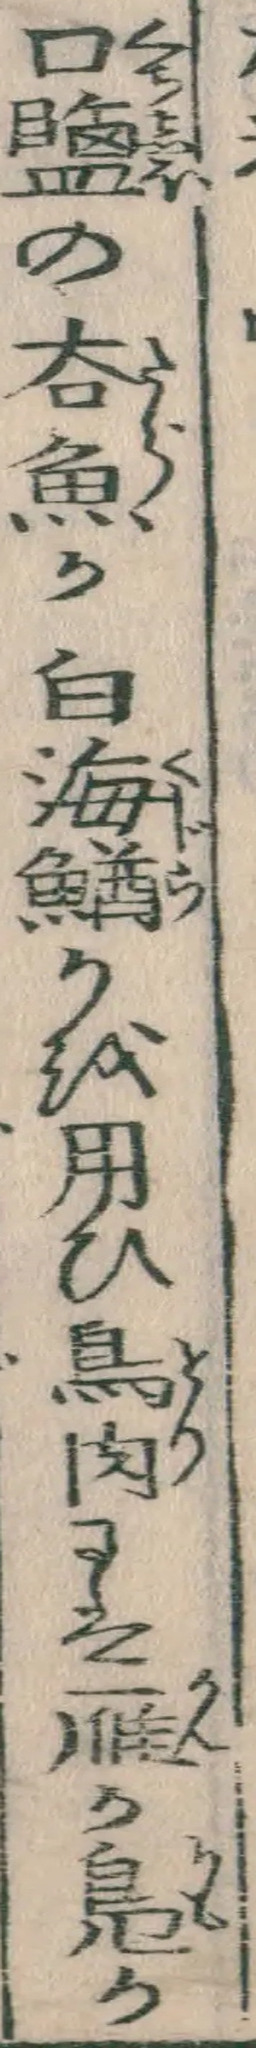口鹽の夻魚か白海鱒かを用ひ鳥肉には雁か鳧か
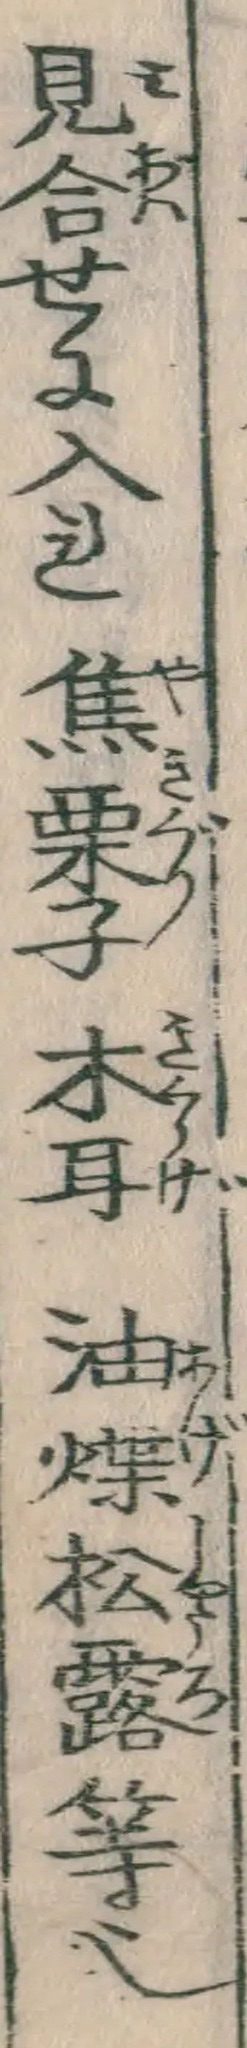見合せに入れ焦栗子木耳油煠松露等也

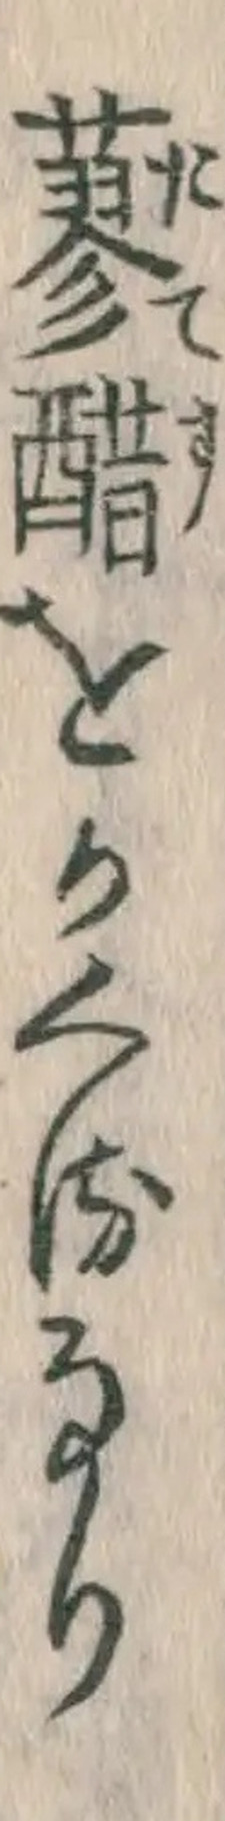蓼醋をかくるなり
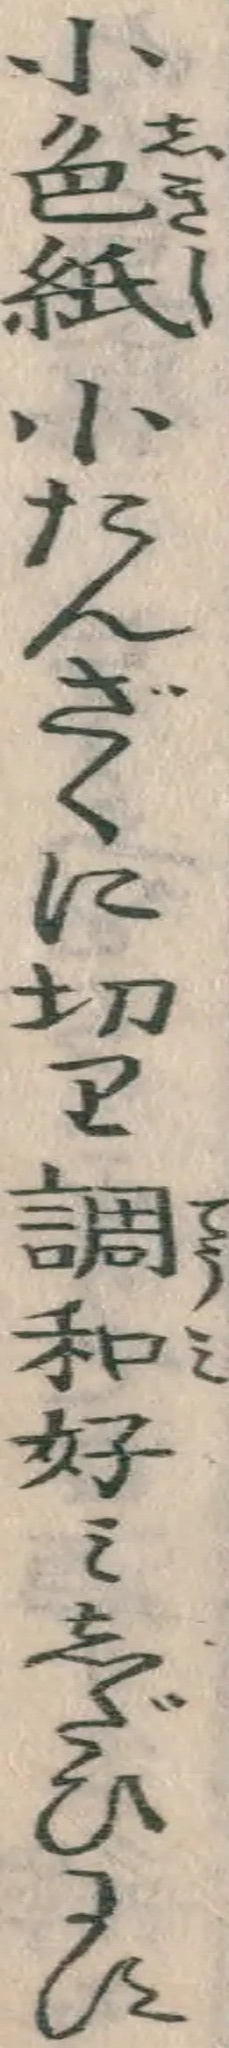小色紙小たんざくに切り調和好みしだひにす
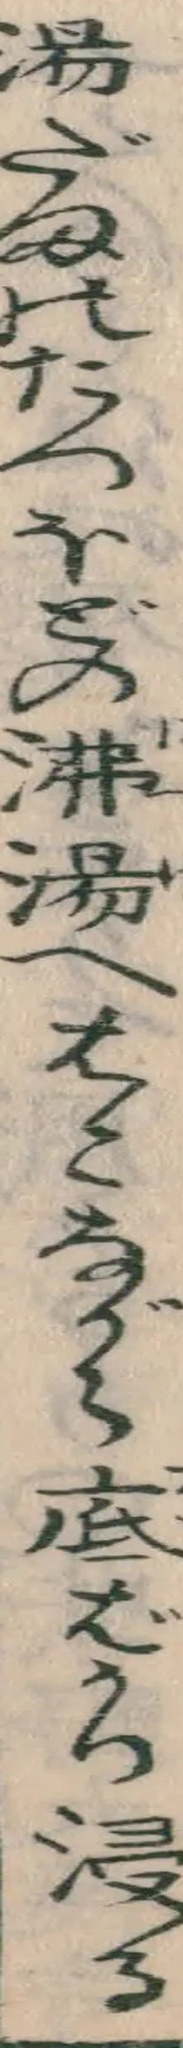湯だまのたつほどの沸湯へはこながら底ばかり浸る
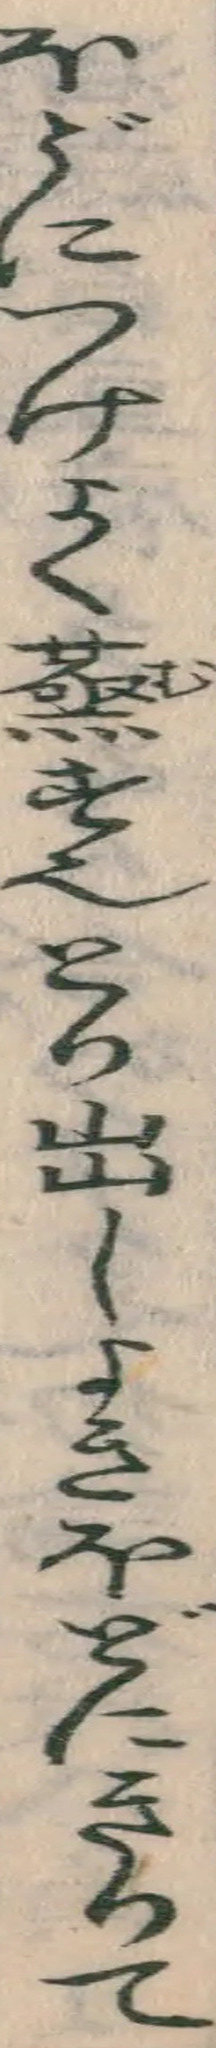ほどにつけよく蒸す也とり出しよきほどにきりて
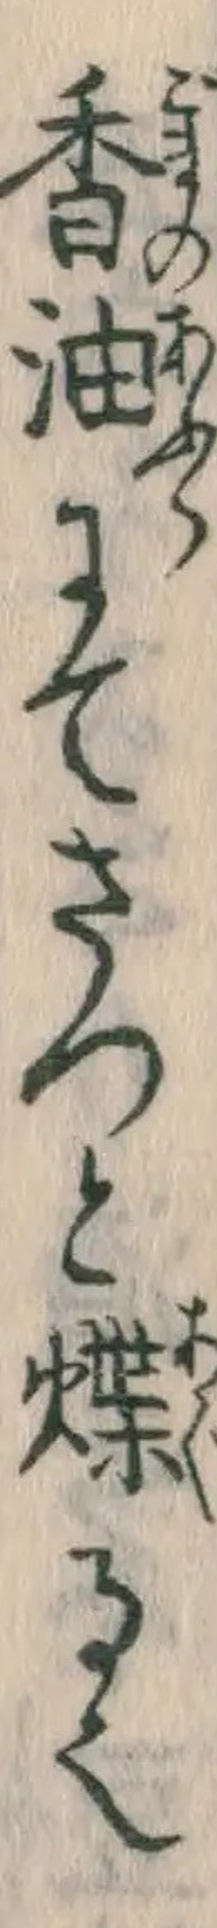香油にてさつと煠る也
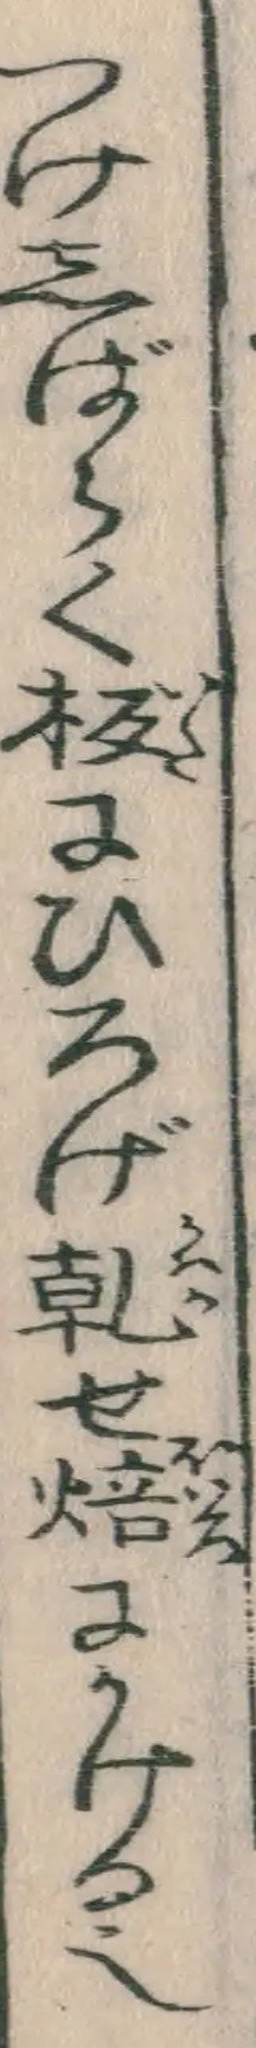つけしばらく板にひろげ乾せ焙にかける也
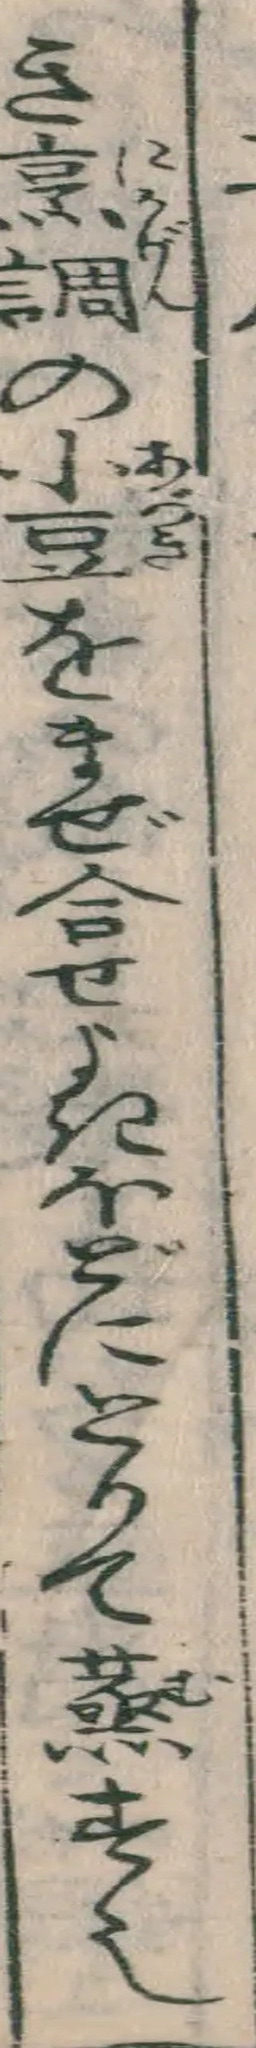き烹調の小豆をまぜ合せよきほどにとりて蒸す也
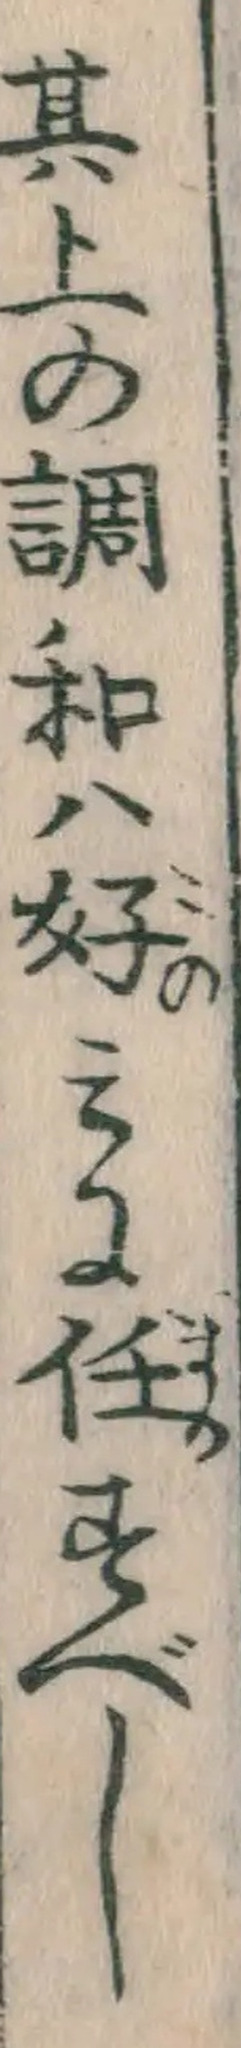其上の調和は好みに任すべし
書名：豆腐百珍. [正編]
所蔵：国立国会図書館 National Diet Library, JAPAN
